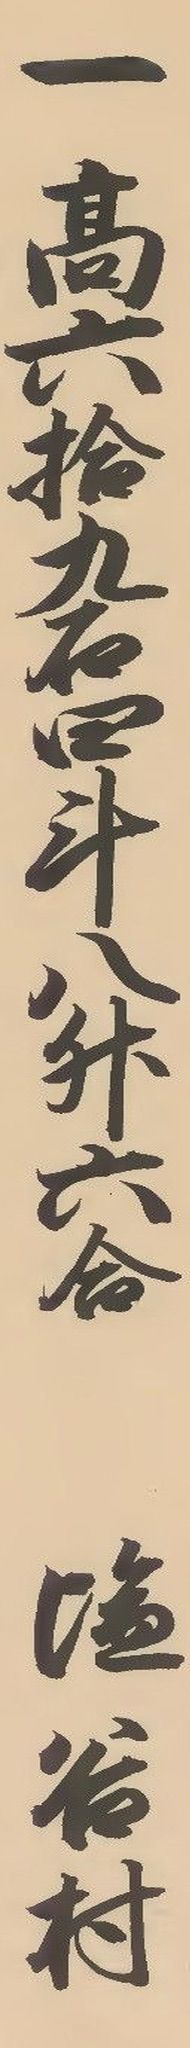一高六拾九石四斗八升六合塩谷村
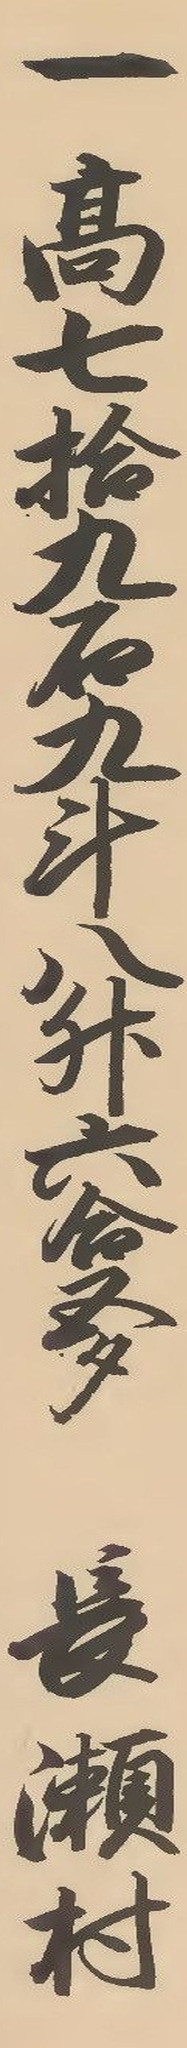一高七拾九石九斗八升六合五勺長瀬村
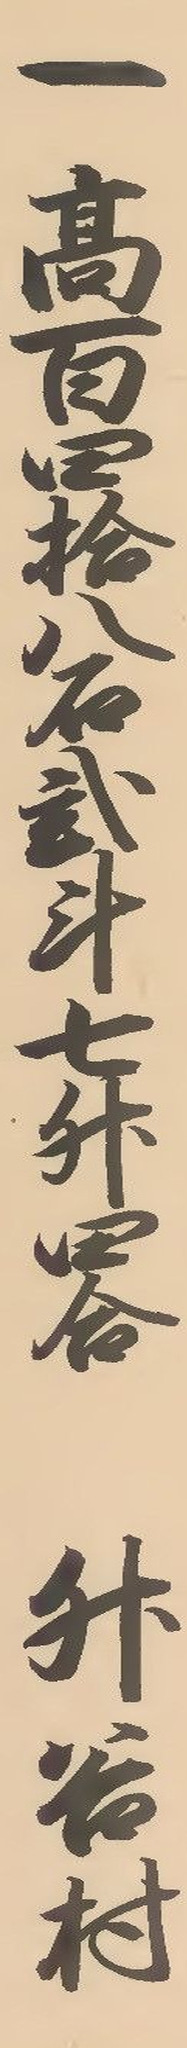一高百四拾八石弐斗七升四合升谷村
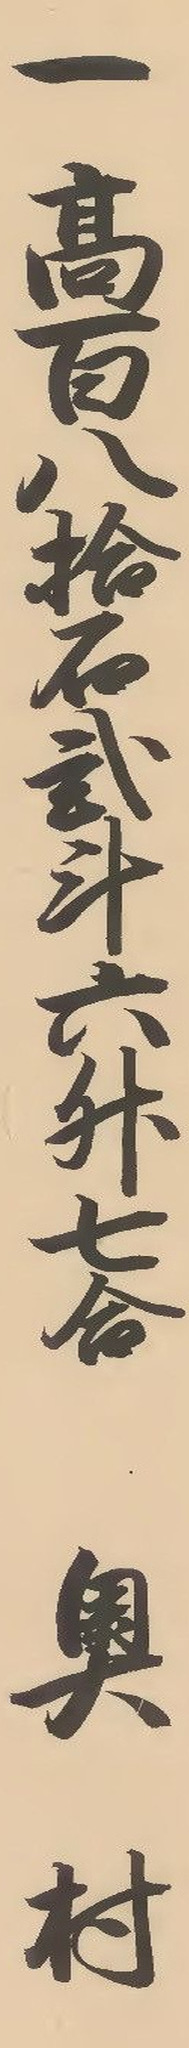一高百八拾石弐斗六升七合奥村
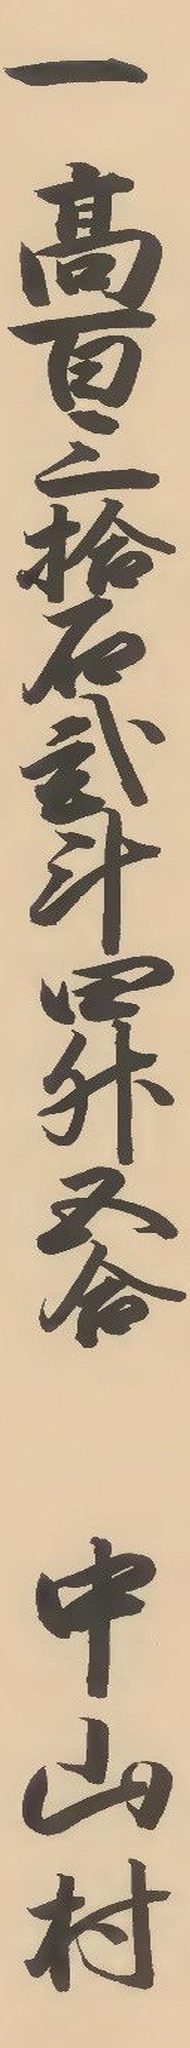一高百三拾石弐斗四升五合中山村
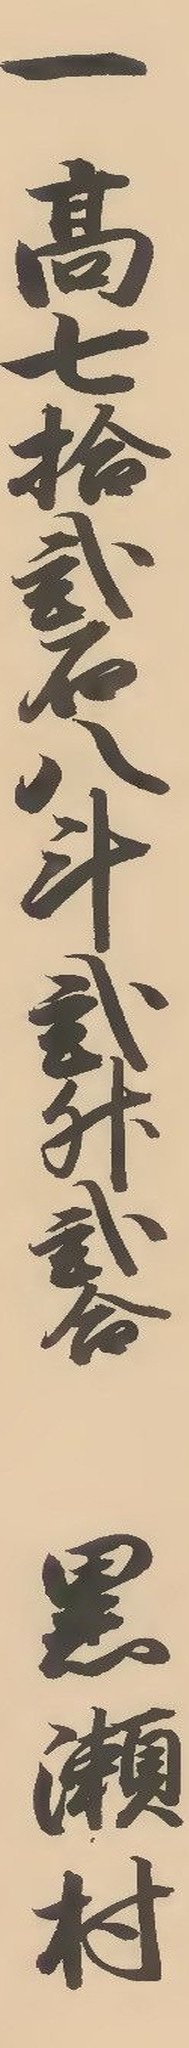一高七拾弐石八斗弐升弐合黒瀬村

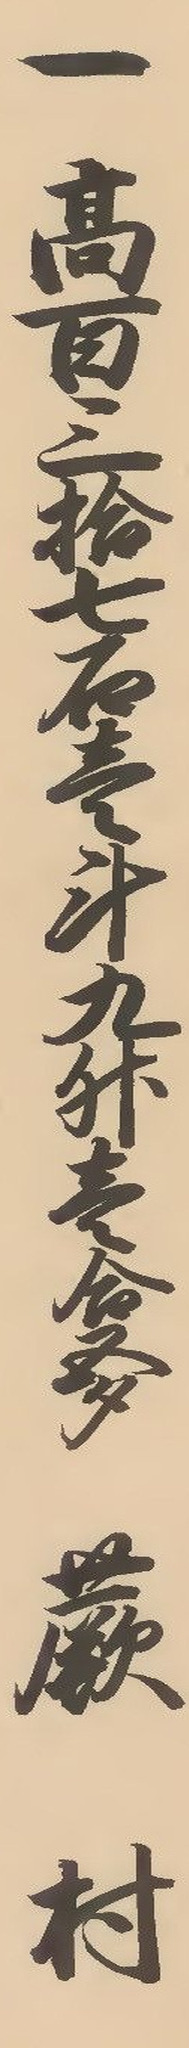一高百三拾七石壱斗九升壱合五勺蕨村
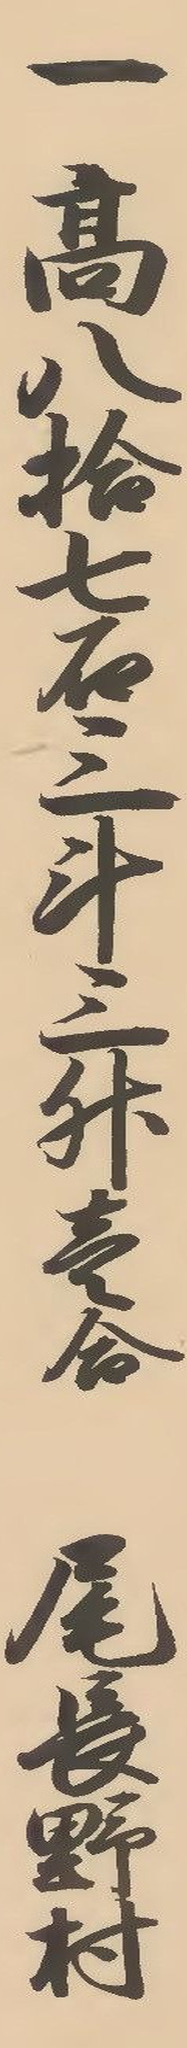一高八拾七石三斗三升壱合尾長野村
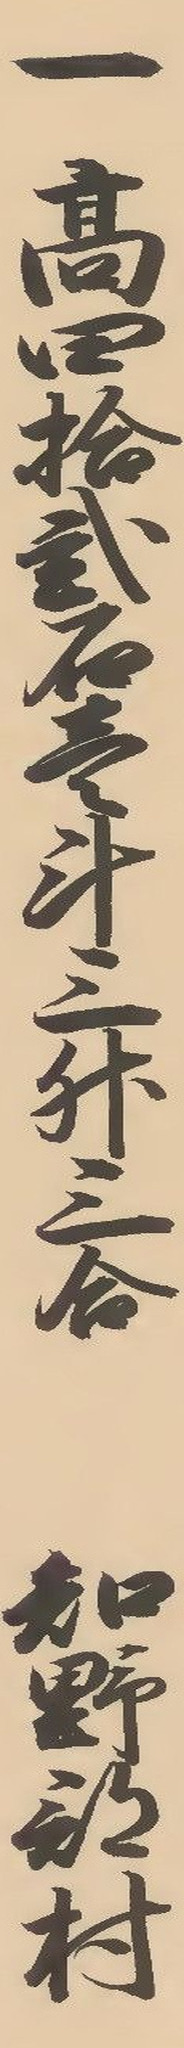一高四拾弐石壱斗三升三合知野部村
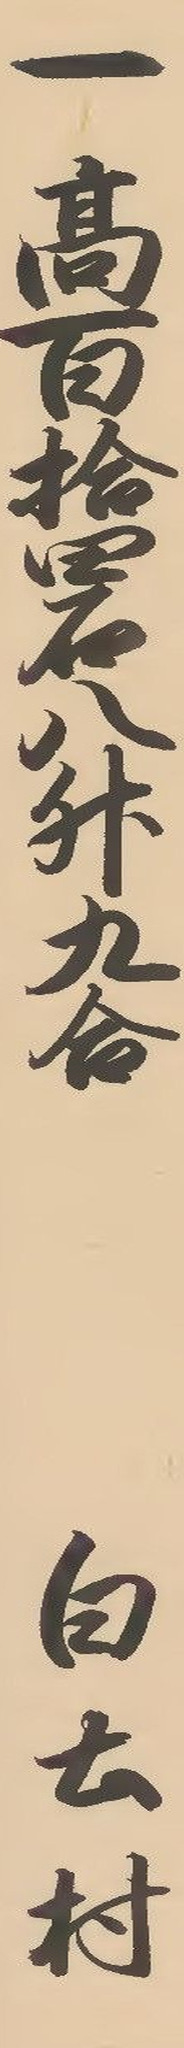一高百拾四石八升九合白土村
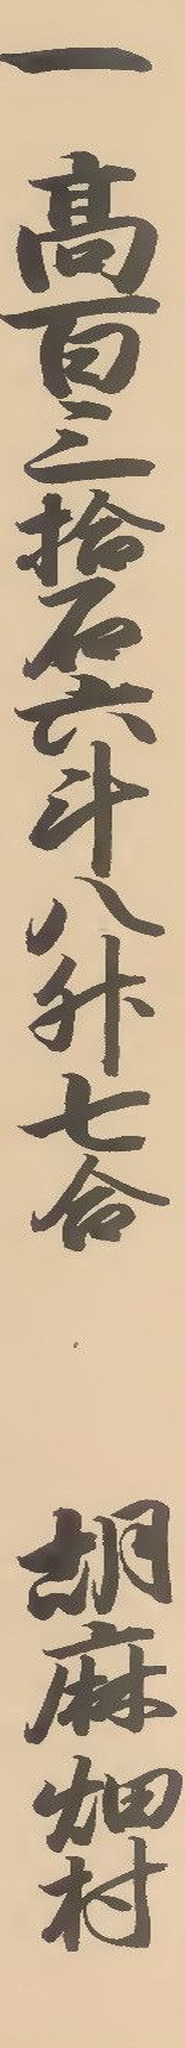一高百三拾石六斗八升七合胡麻畑村
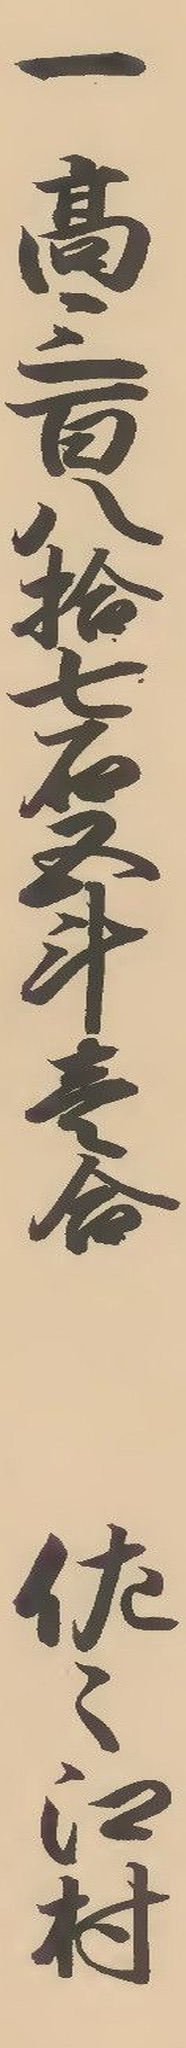一高三百八拾七石五斗壱合佐々江村

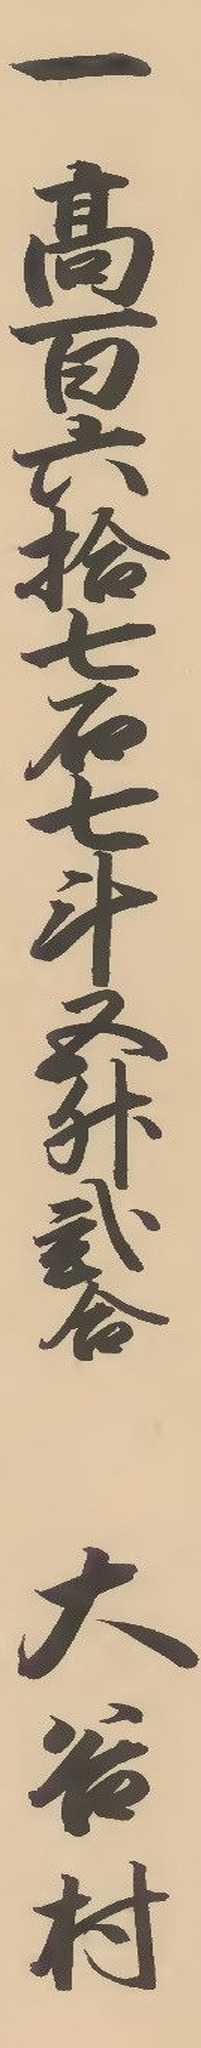一高百六拾七石七斗五升弐合大谷村
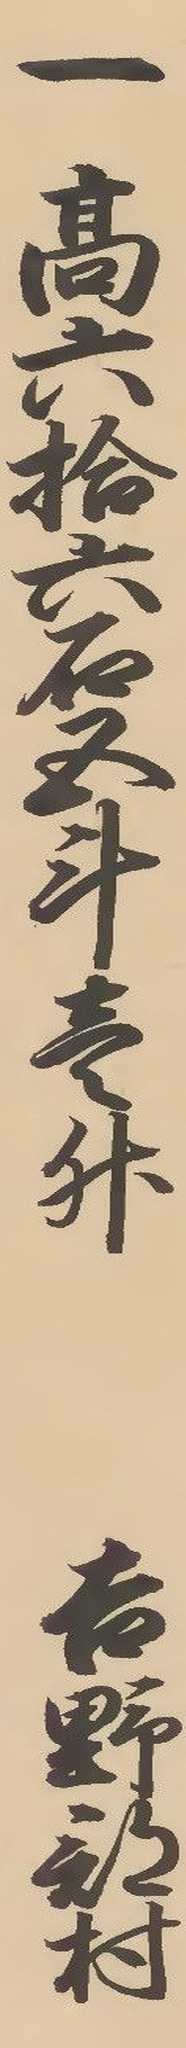一高六拾六石五斗壱升吉野部村
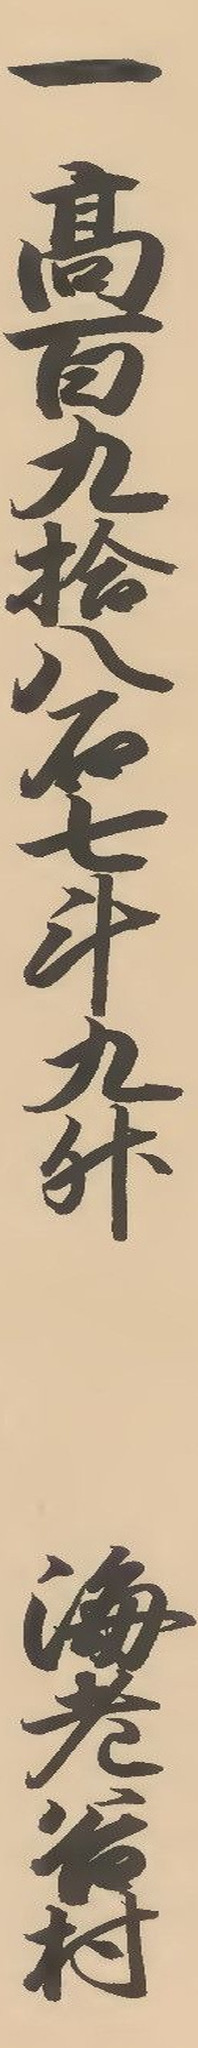一高百九拾八石七斗九升海老谷村
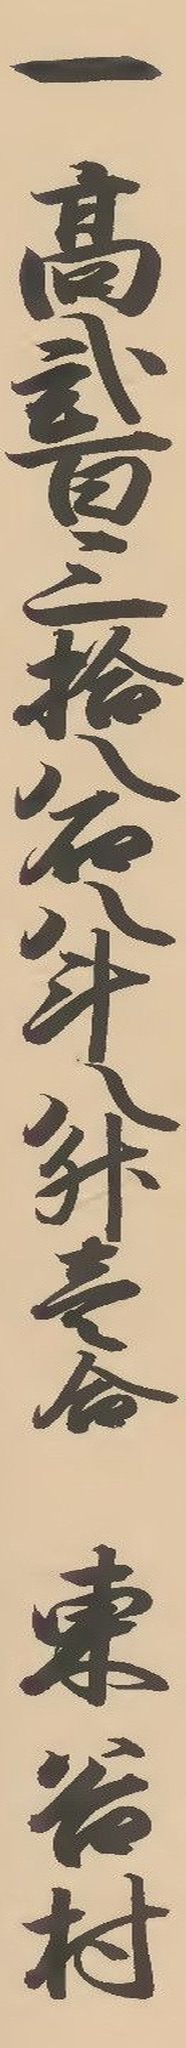一高弐百三拾八石八斗八升壱合東谷村
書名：丹波国郷帳
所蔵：国立公文書館 National Archives of Japan
